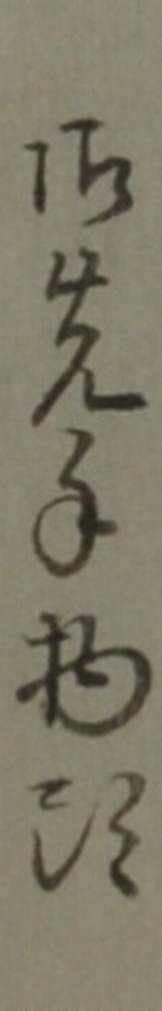御先手物頭
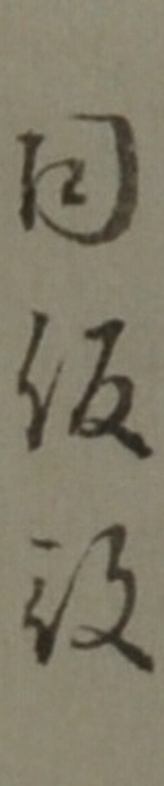同仮役
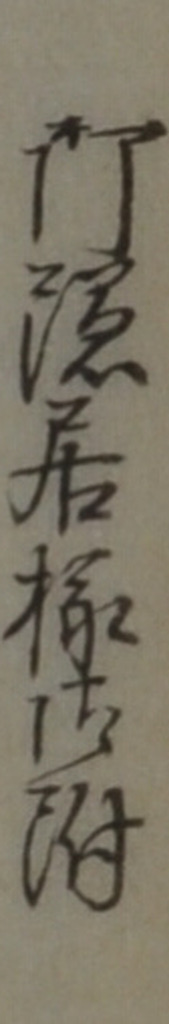御隠居様御附
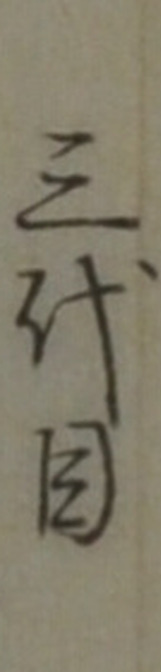三代目
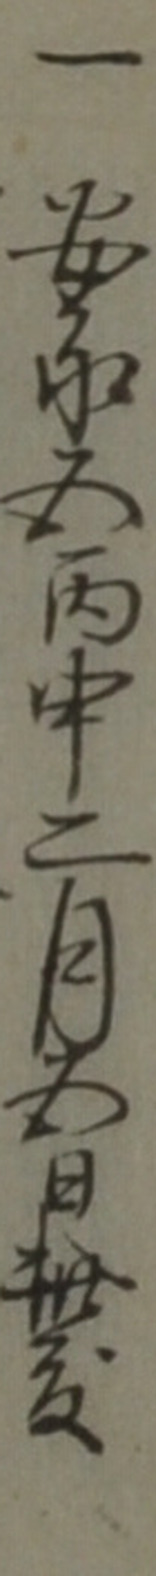一安永五年丙申二月五日此度
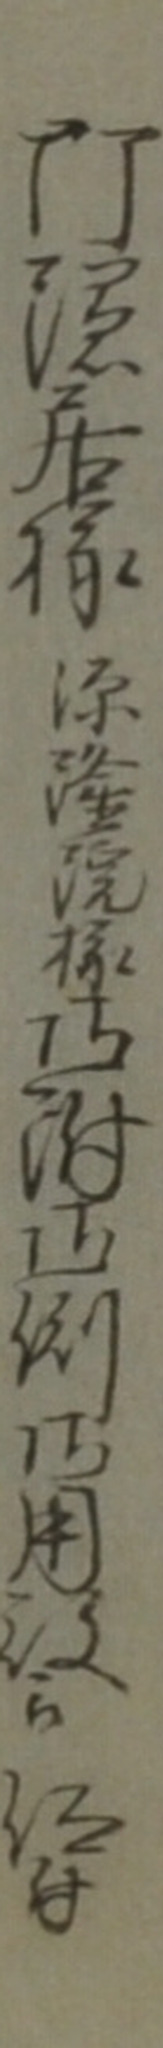御隠居様源隆院様御附御側御用役被仰付
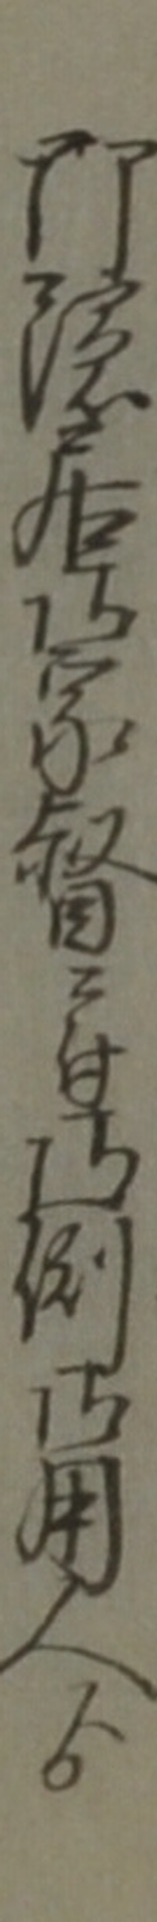御隠居御家督ニ付御側御用人ゟ
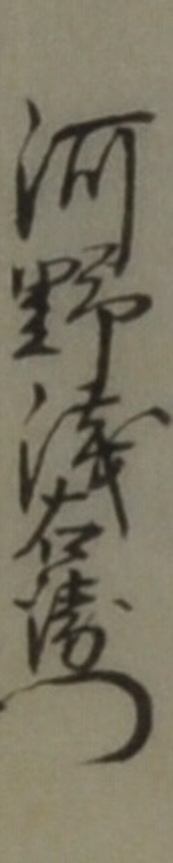河野浅右衛門
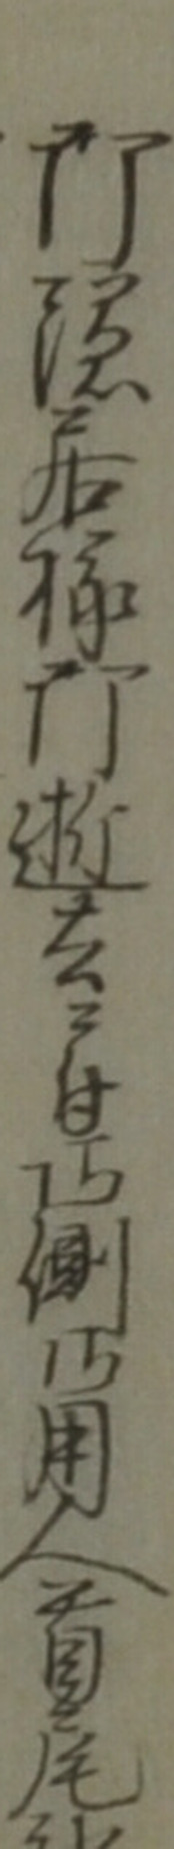御隠居様御逝去ニ付御側御用人首尾能
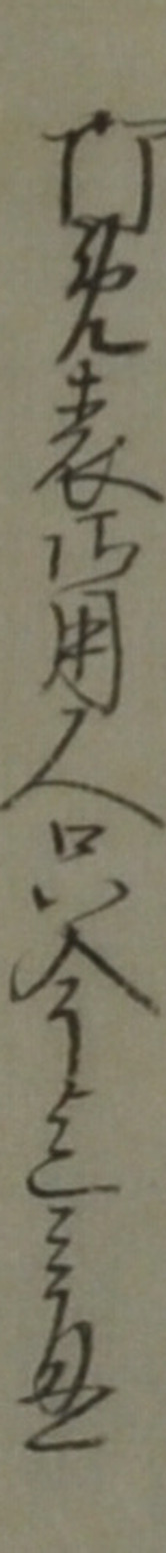御免表御用人只今迄之通
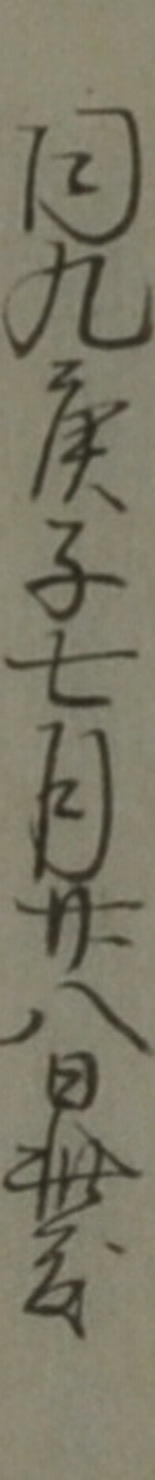一同九庚子七月廿八日此度
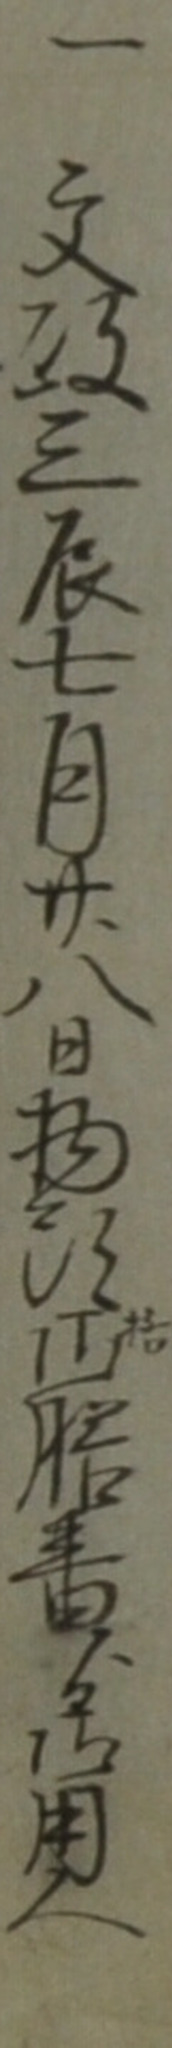一文政三辰七月廿八日物頭格御膳番ゟ御用人
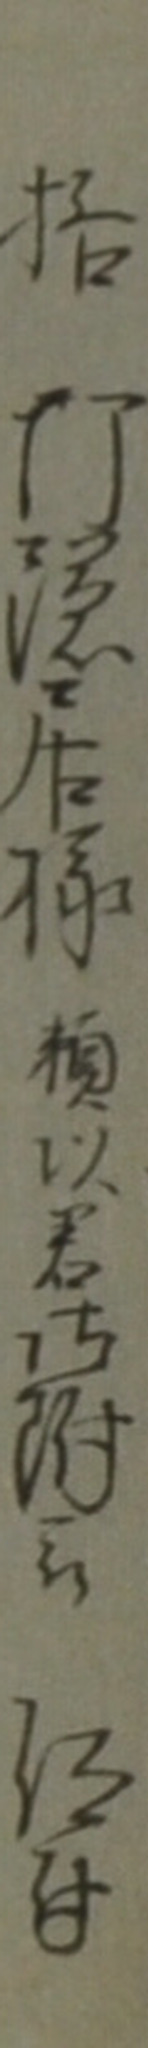格御隠居様頼以君御附被仰付
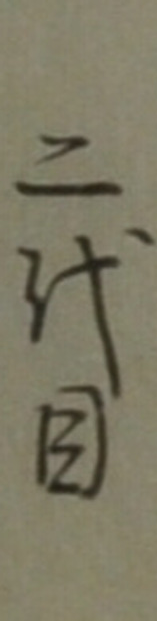二代目
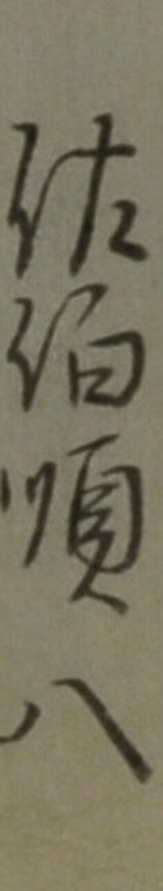佐伯順八
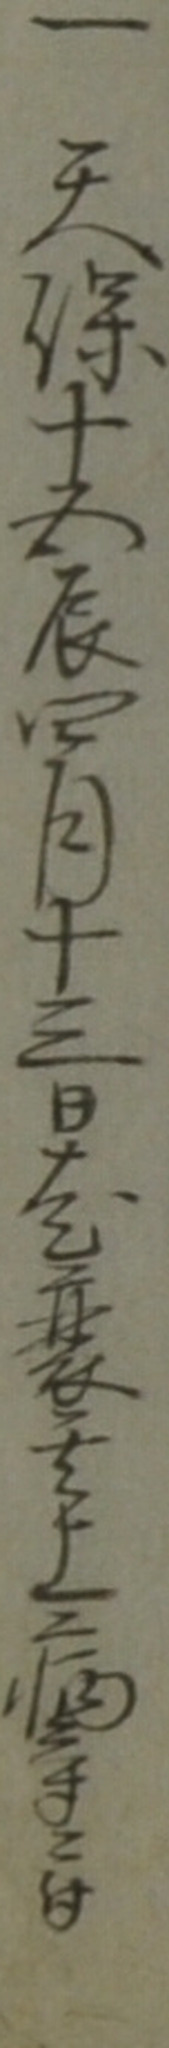一天保十五辰四月十三日老衰其上病気ニ付
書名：諸御役代々録（二）
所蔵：伊那市立高遠町図書館・合同会社AMANE
